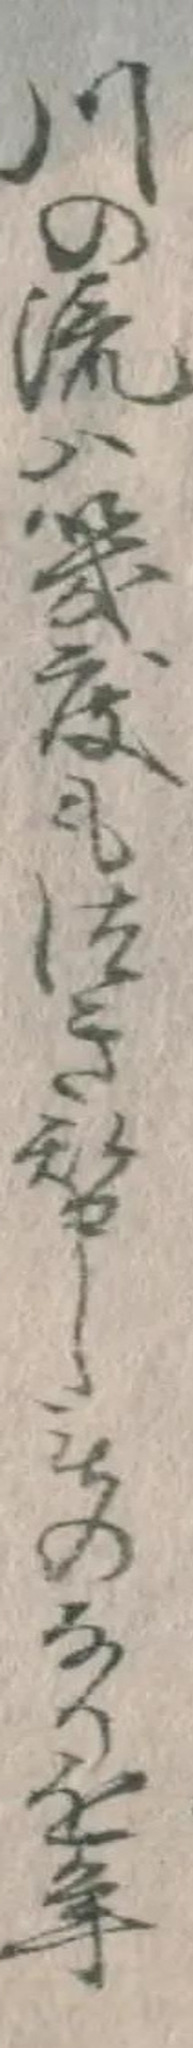川の流は幾度もつき替しものなり近年
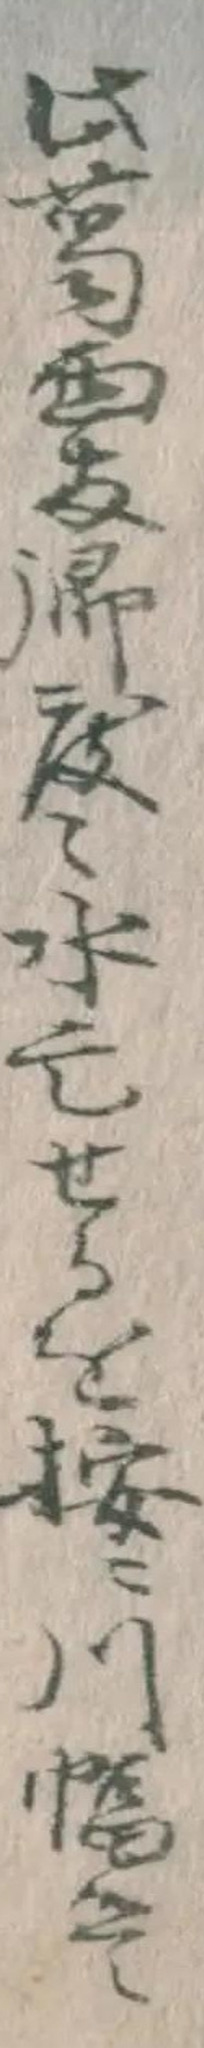此葛西両郷度々水亡せるを按に川幅は
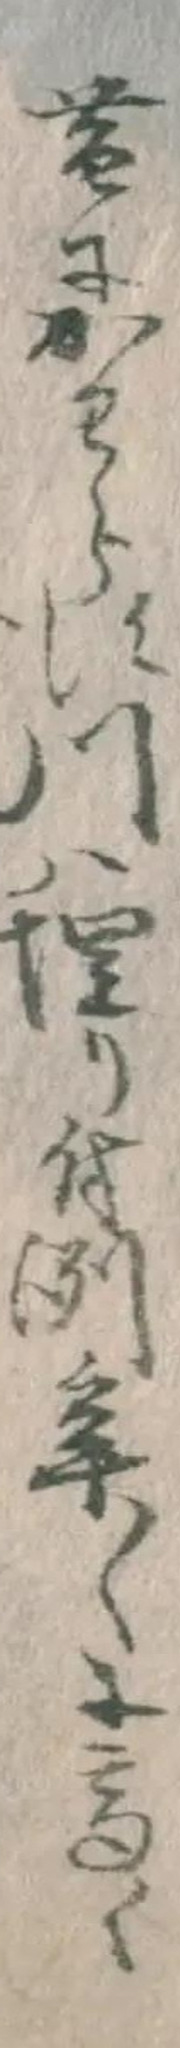昔にかわらす川は埋り付洲年〳〵に高く
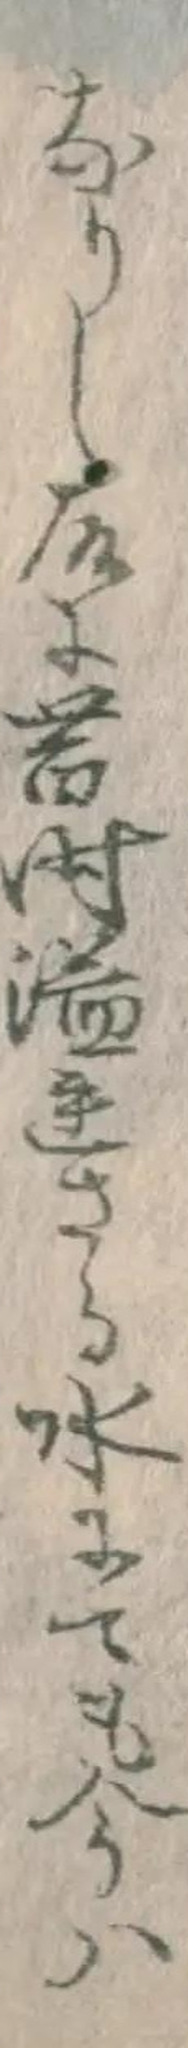なりし故に昔時溢れさる水にても今は
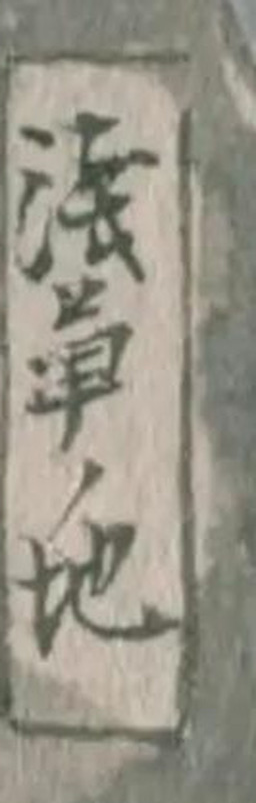浅草ノ地
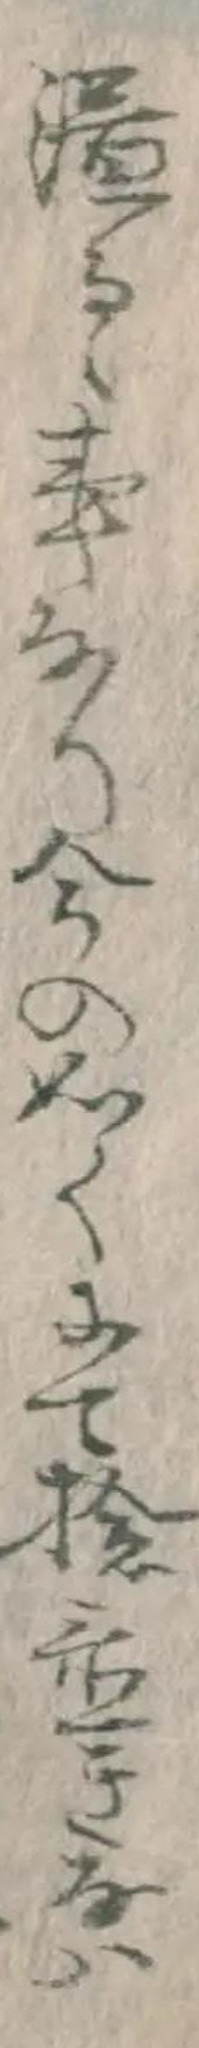溢るゝ事なり今の如くにて捨置きなは
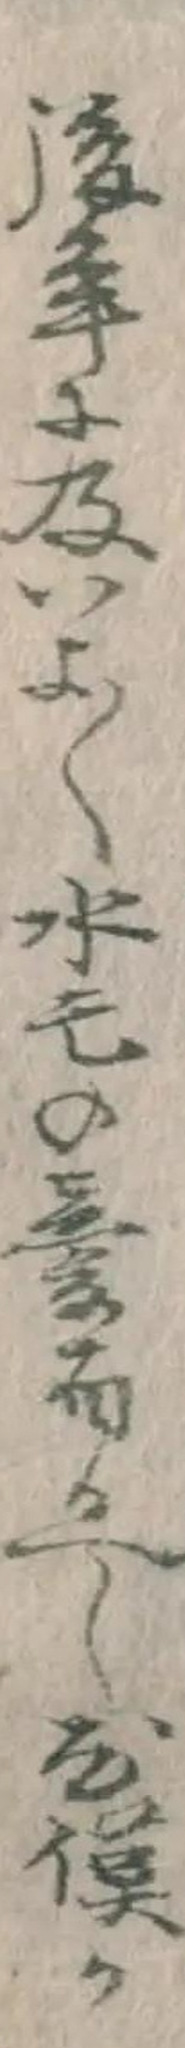後年に及いよ〳〵水亡の憂有るへし尤僅か
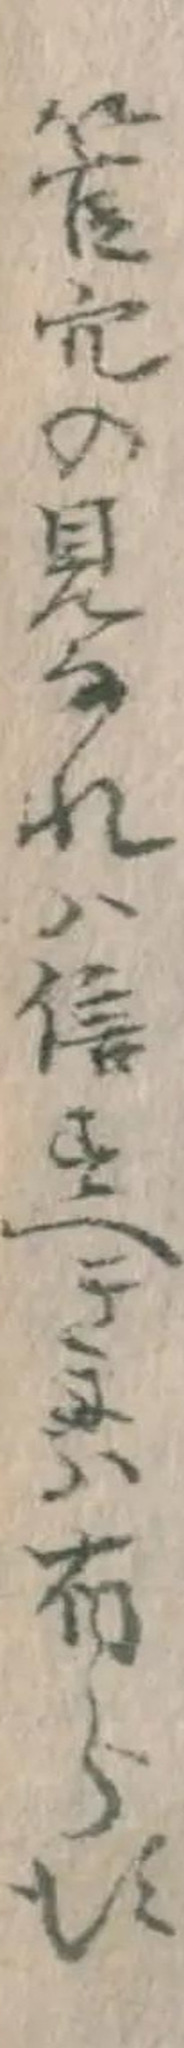管穴の見なれは信すへきには有らす

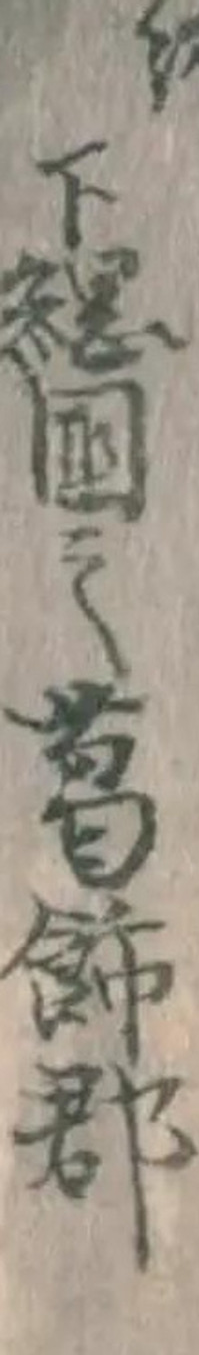総テ下総国之葛飾郡
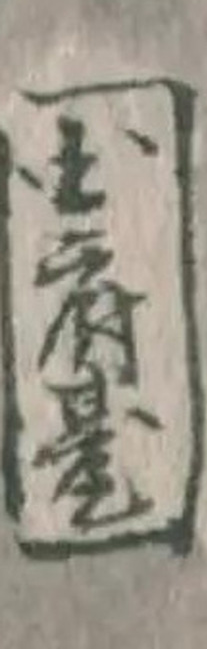国府台
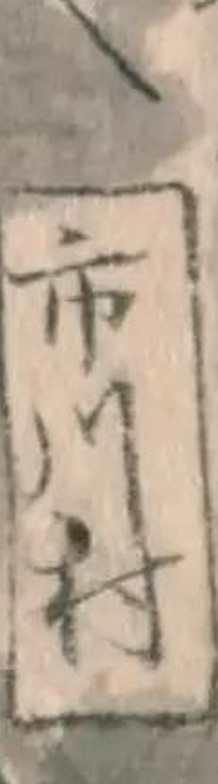市川村
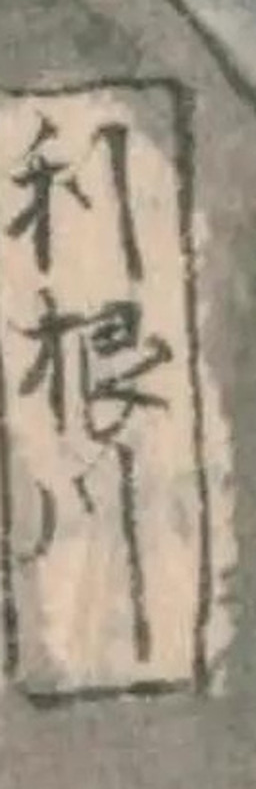利根川
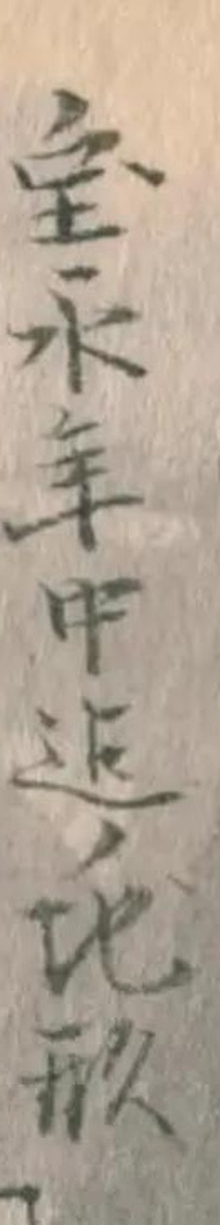宝永年中迄ノ地形
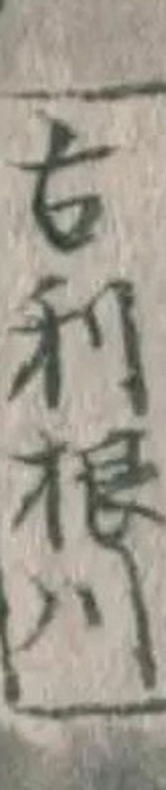古利根川
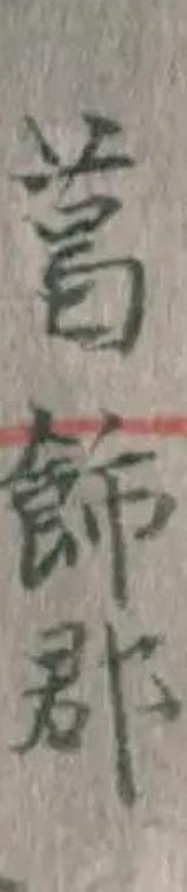葛飾郡
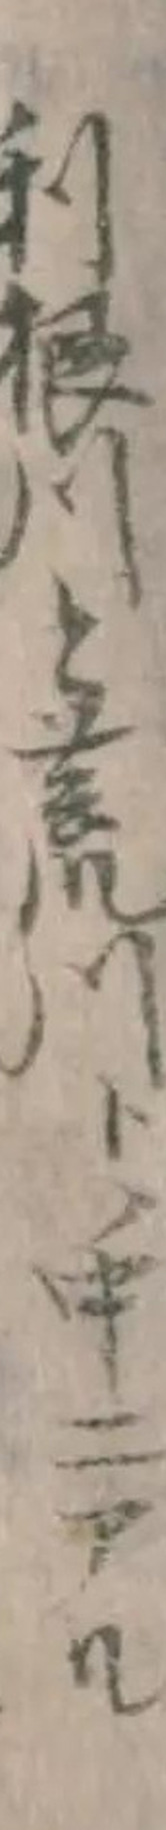利根川と荒川トノ中ニアル
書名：四神地名録 6巻. [4]葛飾郡
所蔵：国立国会図書館 National Diet Library, JAPAN
